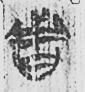周
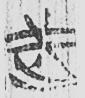武
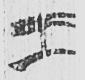王
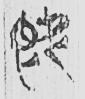既
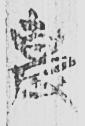尅
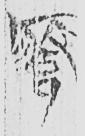{殷邑}
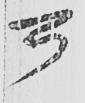乃
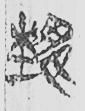埶
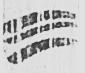三
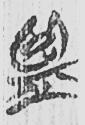監
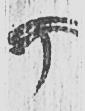于
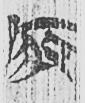殷
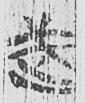武
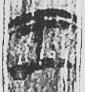王
